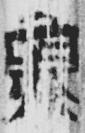录（祿）
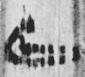㠯（以）
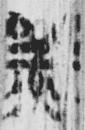襄
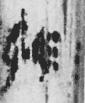於
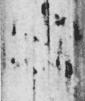來
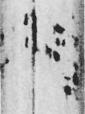亦亦
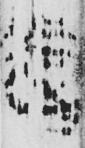迵迵
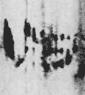曰
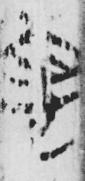惪（德）
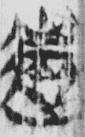速
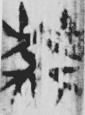蓑
